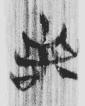若
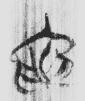龜
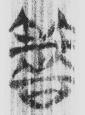{竹巫口}
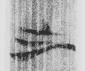之
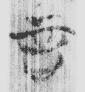言
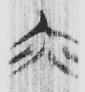亦
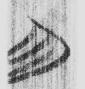勿
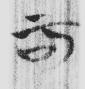可
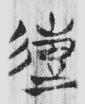{辶叀}
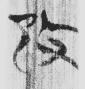改
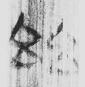𢆶
